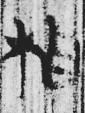相
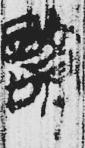○（就）
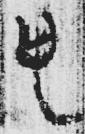也
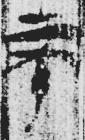不
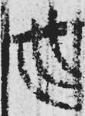必
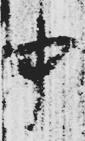才（在）
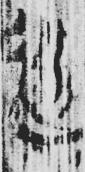近
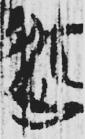迡（昵）
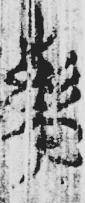藥（樂）
